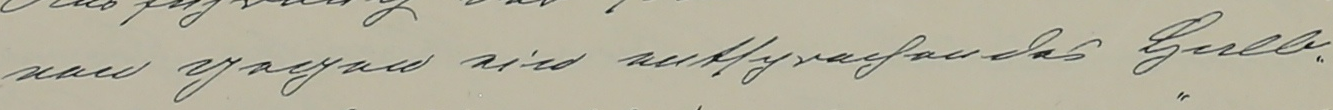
nen gegen ein entsprechendes Halb-
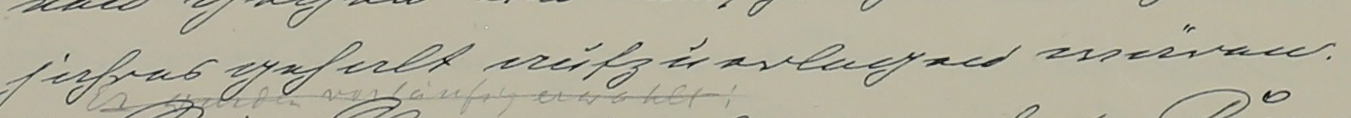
jahresgehalt aufzuerlegen wären.
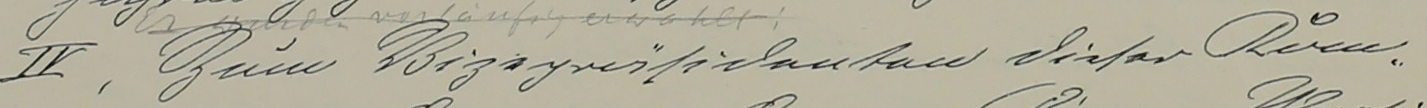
IV. Zum Vizepräsidenten dieser Kom-
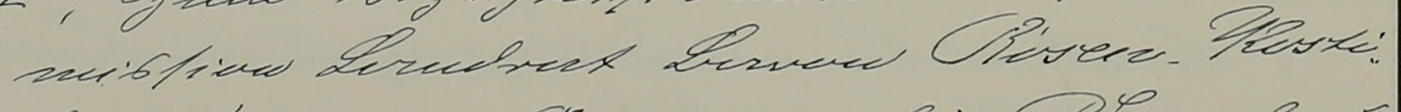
mission Landrat Baron Rosen-Kosti-
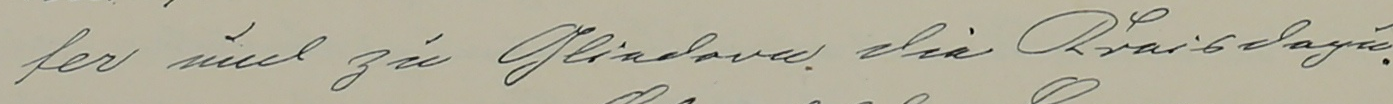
fer und zu Gliedern die Kreisdepu-
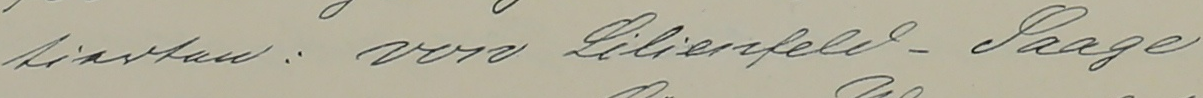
tierten: von Lilienfeld-Saage
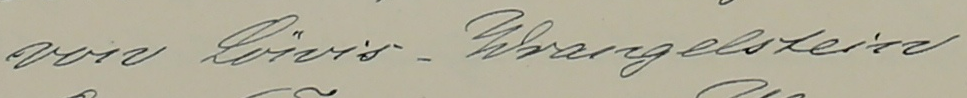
von Löwis-Wrangelstein
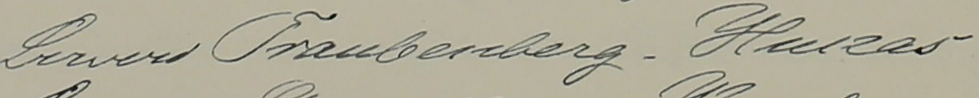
Baron Traubenberg-Hukas
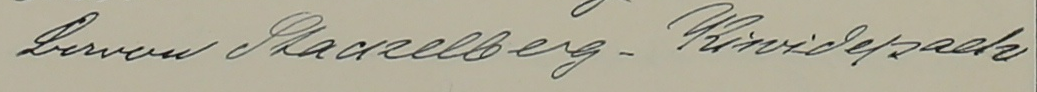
Baron Stackelberg-Kiwidepaeh
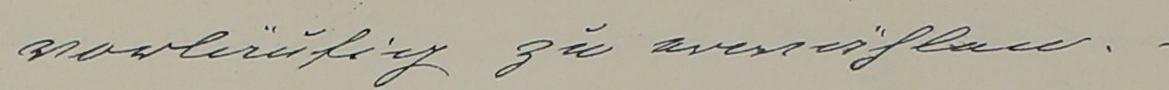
vorläufig zu erwählen.
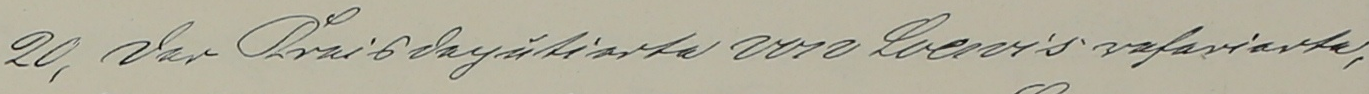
20. Der Kreisdeputierte von Loewis referierte,
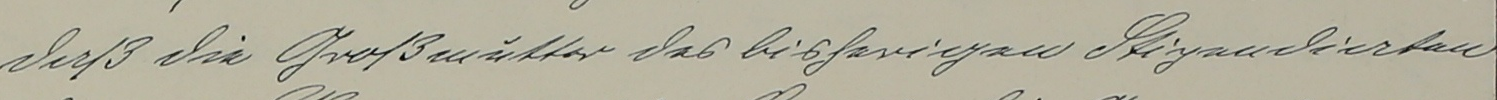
daß die Großmutter des bisherigen Stipendiaten
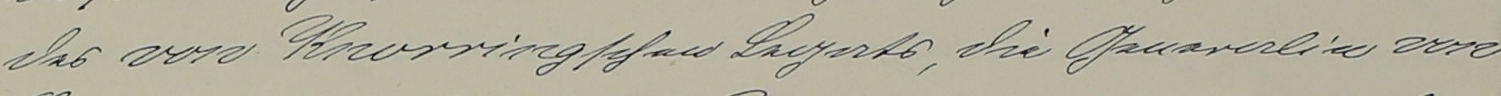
des von Knorringschen Legats, die Generalin von
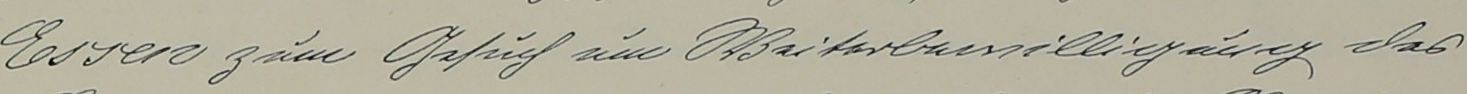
Essen zum Gesuch um Weiterbewilligung des
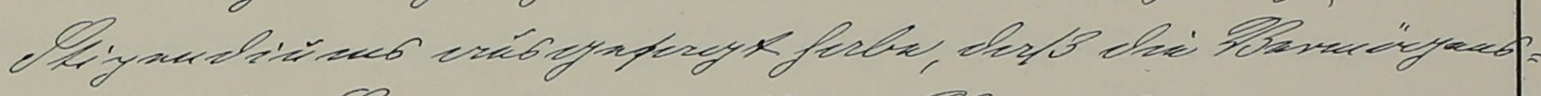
Stipendiums ausgesagt habe, daß die Vermögens-
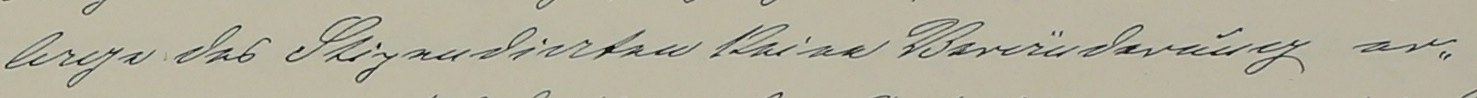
lage des Stipendiaten keine Veränderung er-
